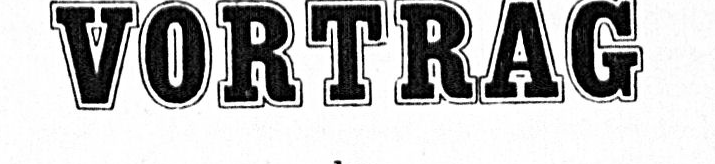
VORTRAG
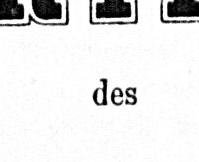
des
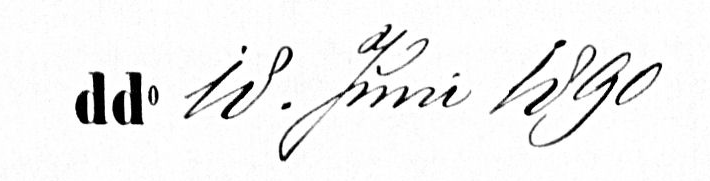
dd° 18. Juni 1890
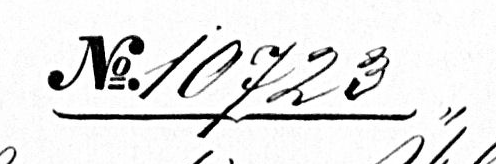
Nr. 10723
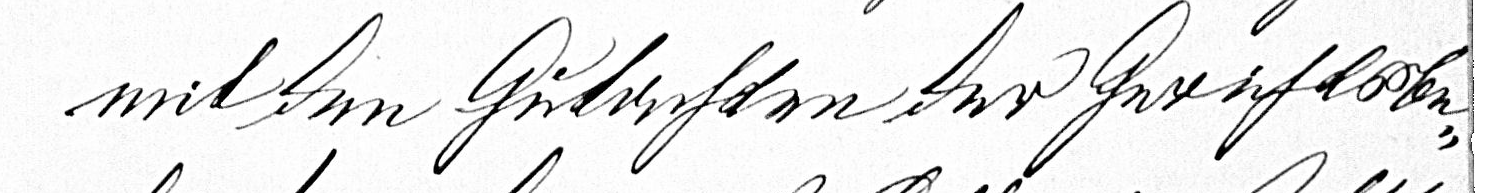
mit den Gutachten der Gerichtsbe¬
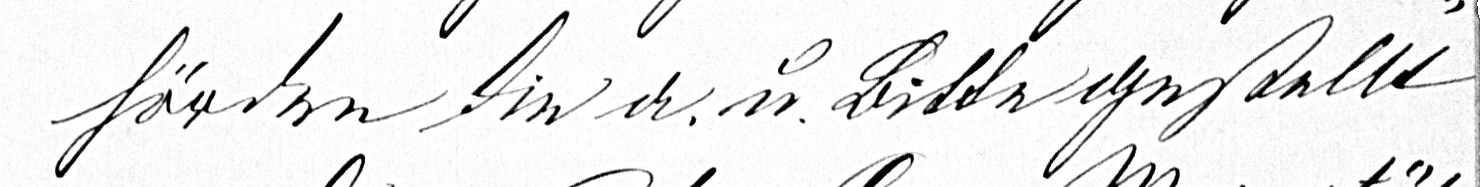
hörden die a. u. Bitte gestellt
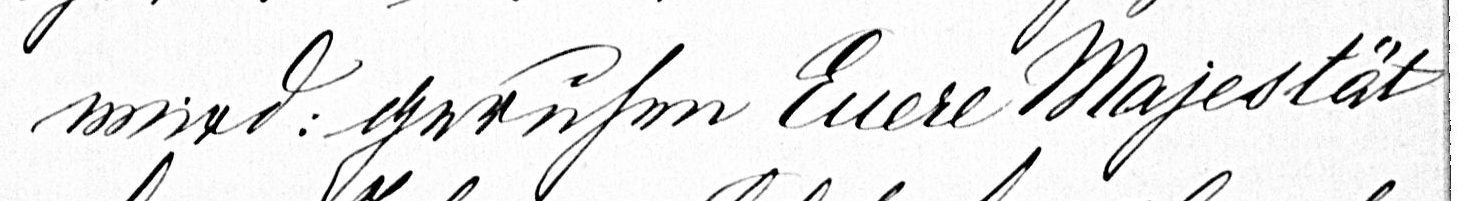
wird: gerufen Euere Majestät
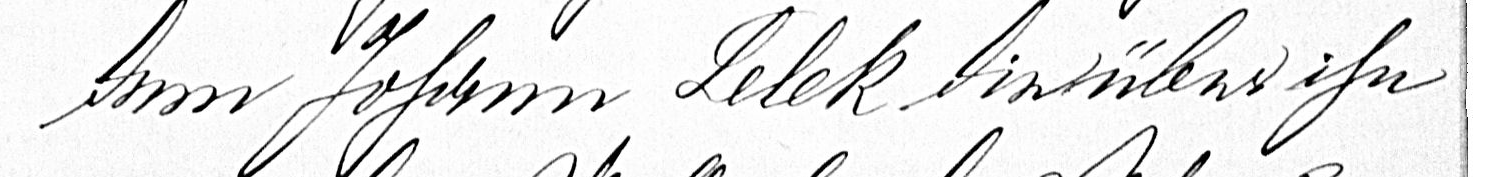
dem Johann Lelek hierüber ihn
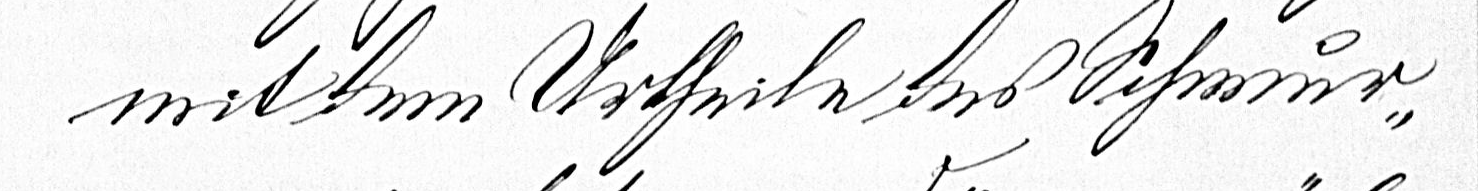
mit dem Urtheile des Schwur¬
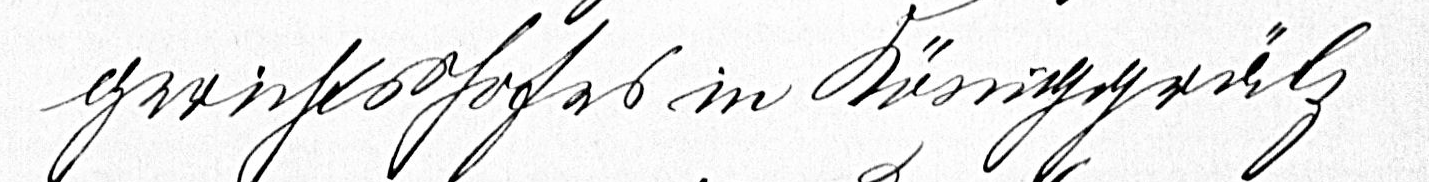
gerichtshofes in Kössiggrälz
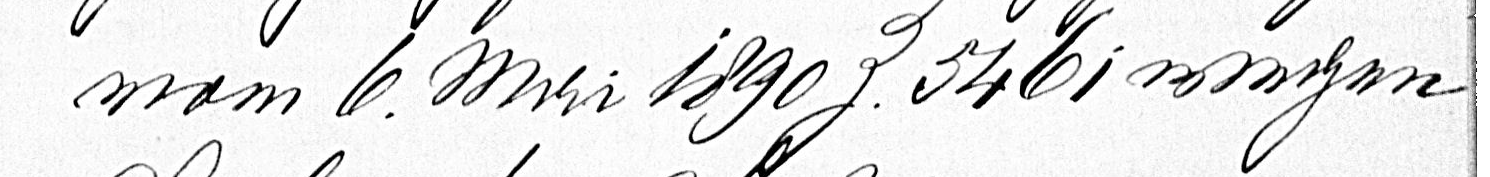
vom 6. Mai 1890 Z. 5461 wegen
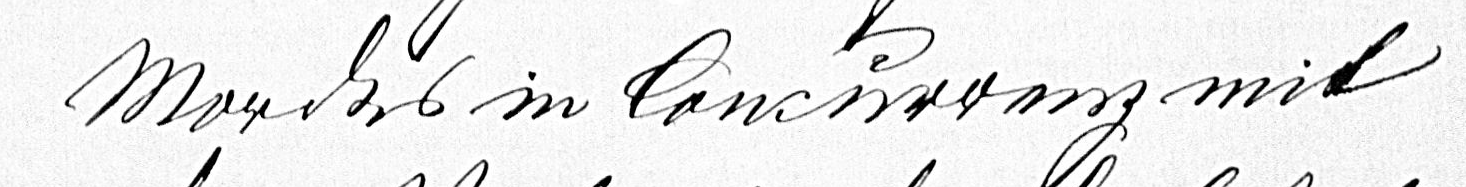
Mordes in Concurrenz mit
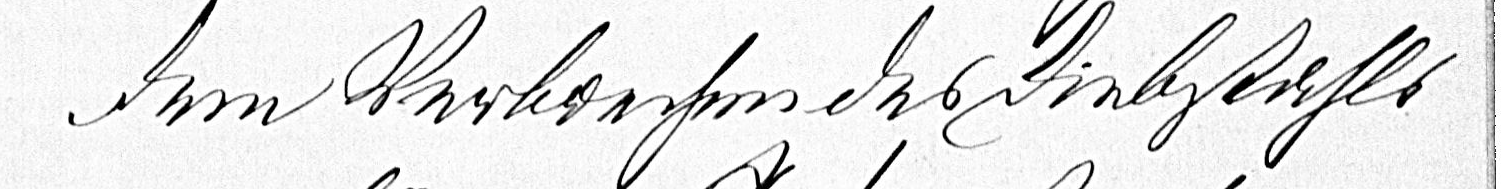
dem Verbrechen des diebstahls
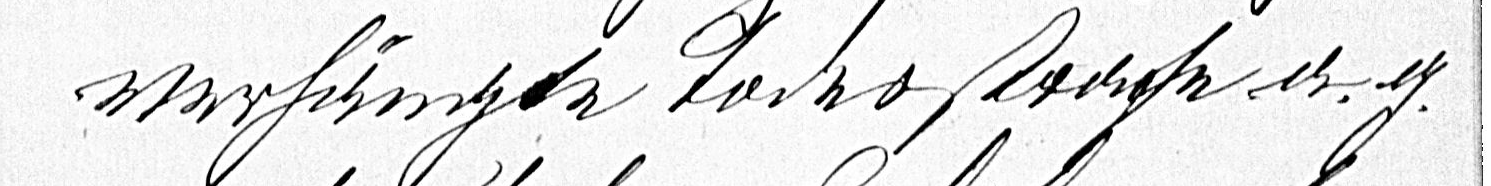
verhängte Todesstrafe a. g.
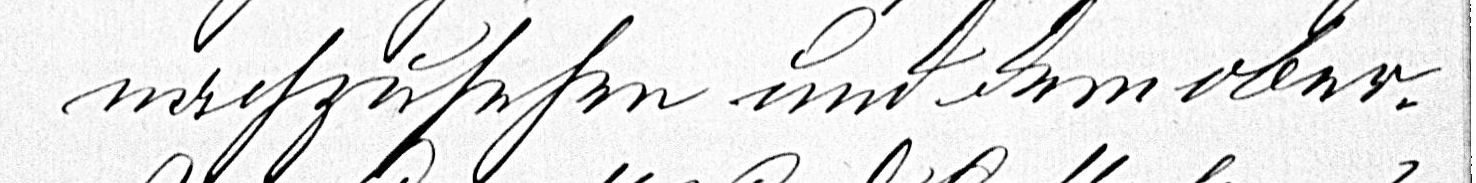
machzusehen und dem ober¬
